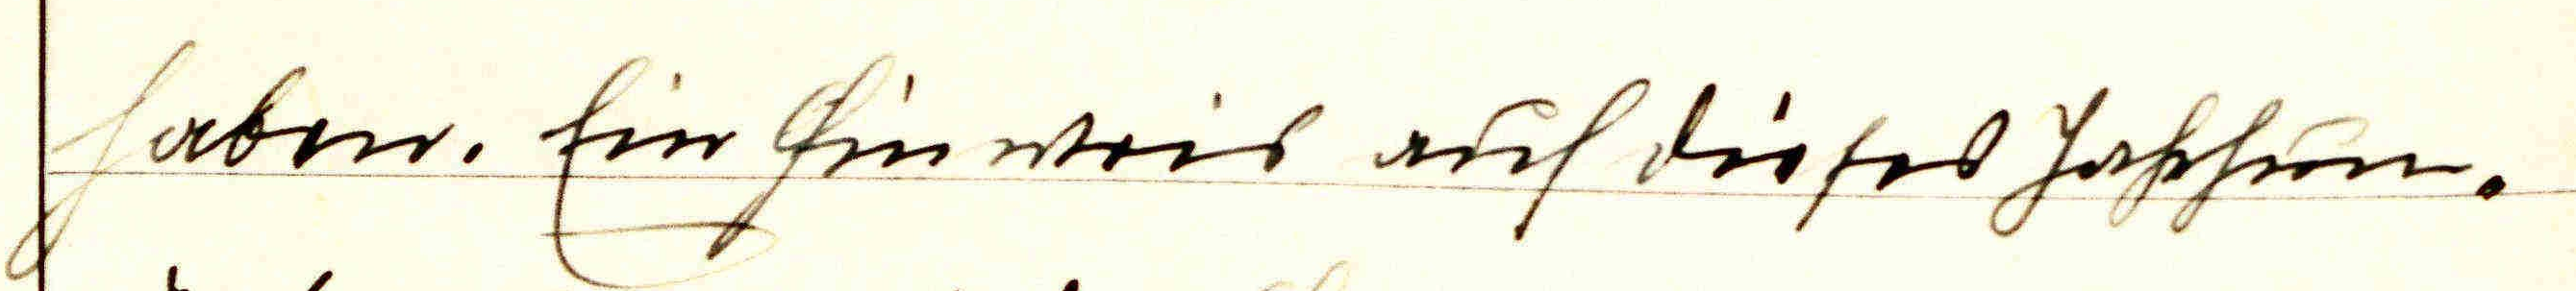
haben. Ein Hinweis auf dieses Jahrhun.
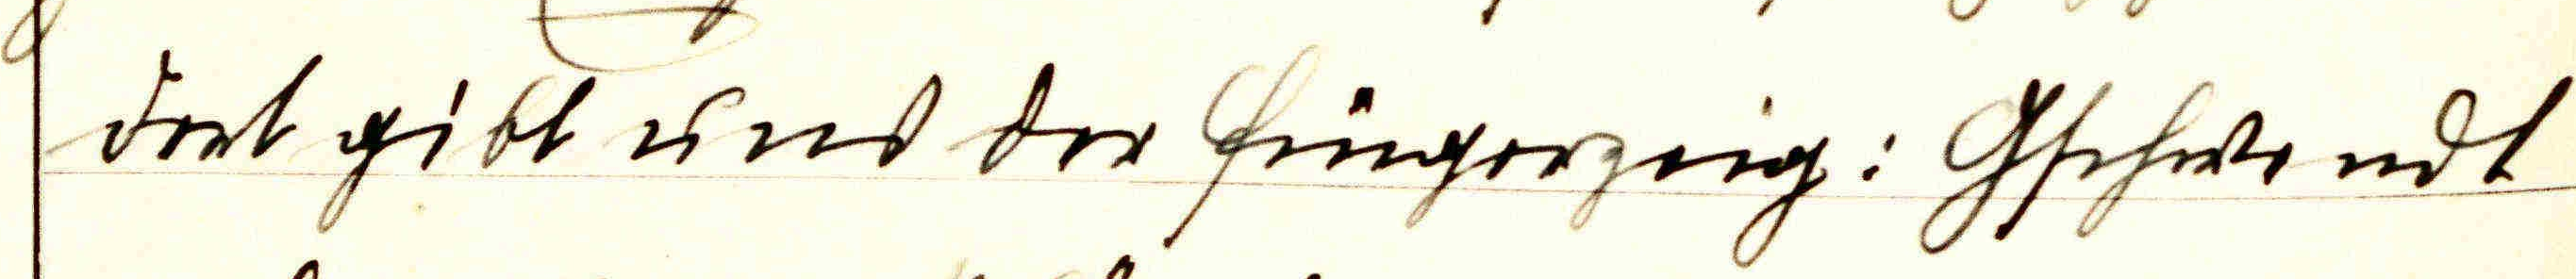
dort gibt uns der Fingerzeig: Gschwendt
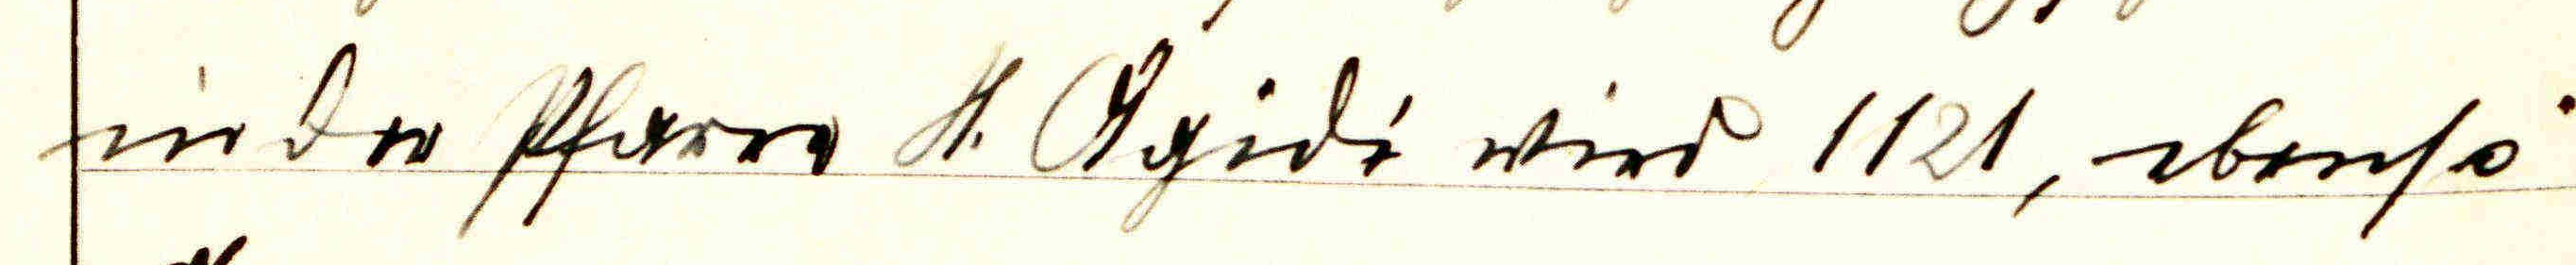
in der Pfarre St, Agidi wird 1121, ebenso
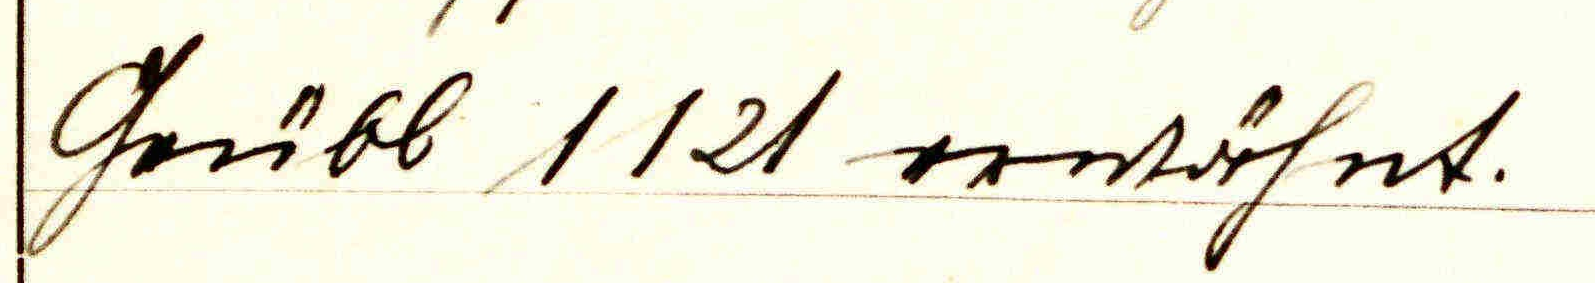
Grübl 1121 erwähnt.
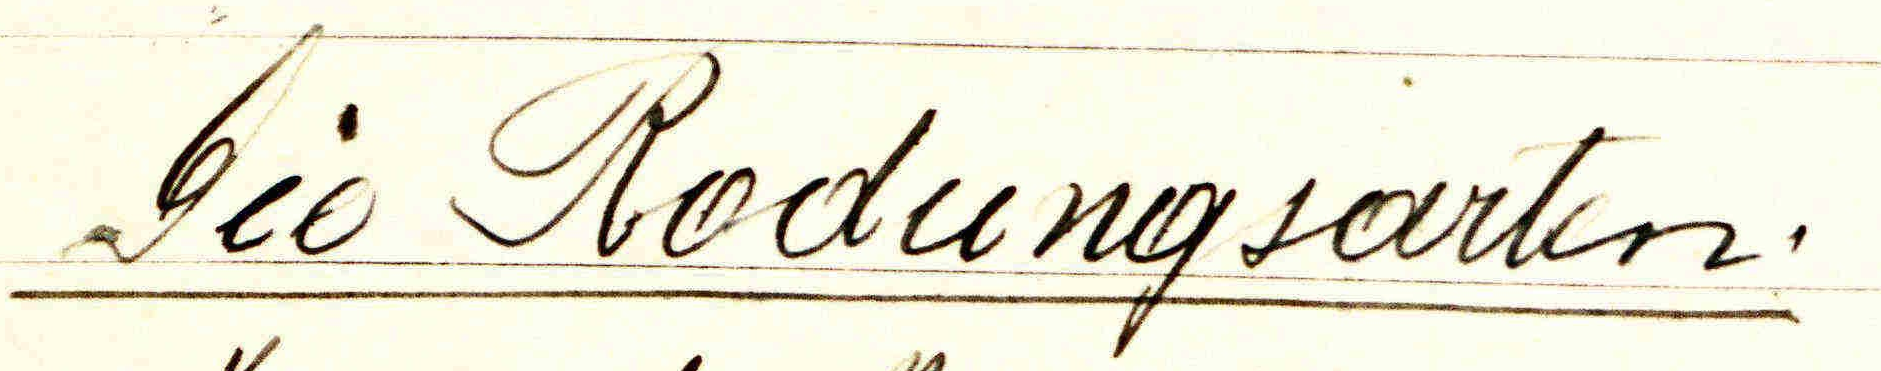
Die Rodungsarten:
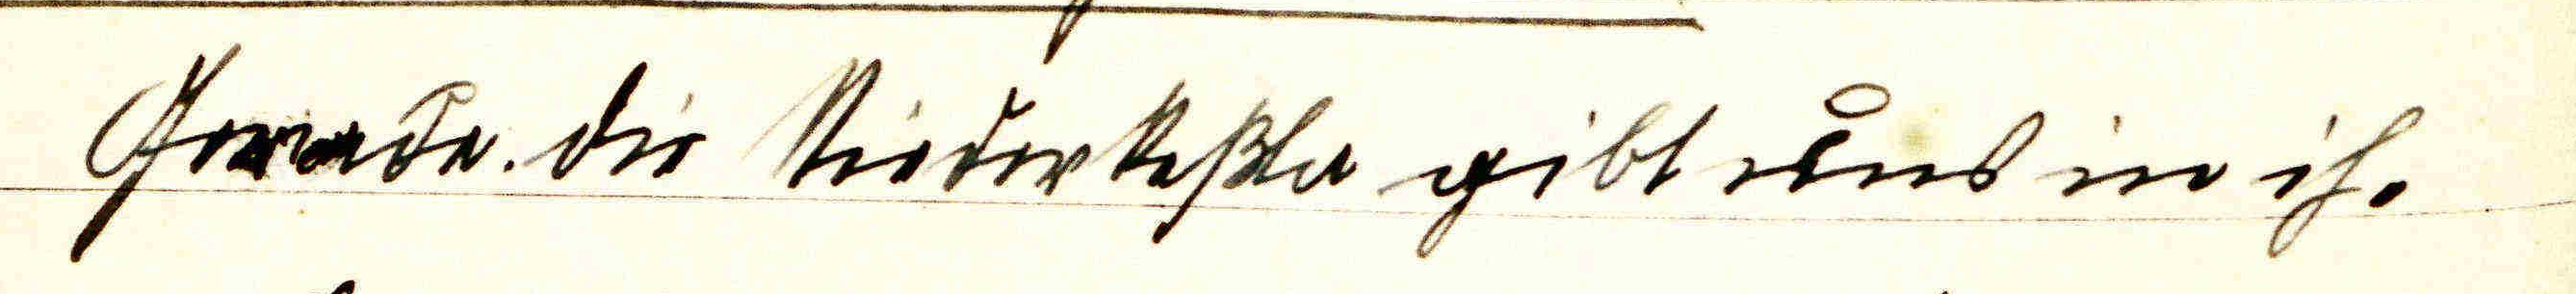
Gerade die Niederkeßla gibt uns in ih-
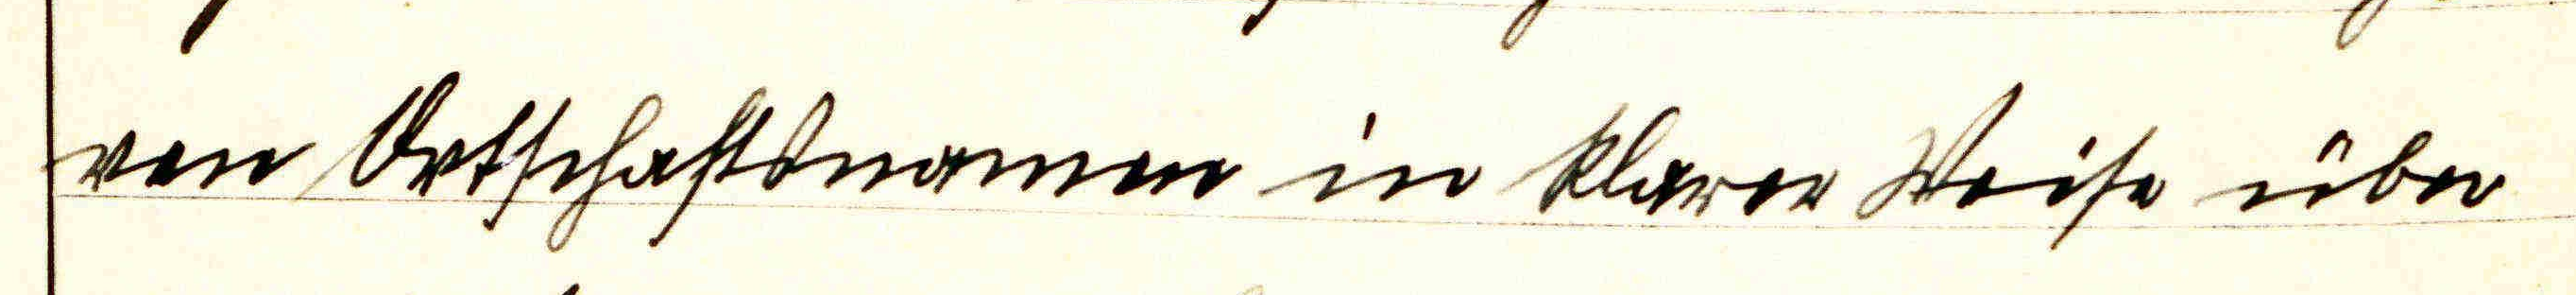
ren Ortschaftsnamen in klarer Weise über
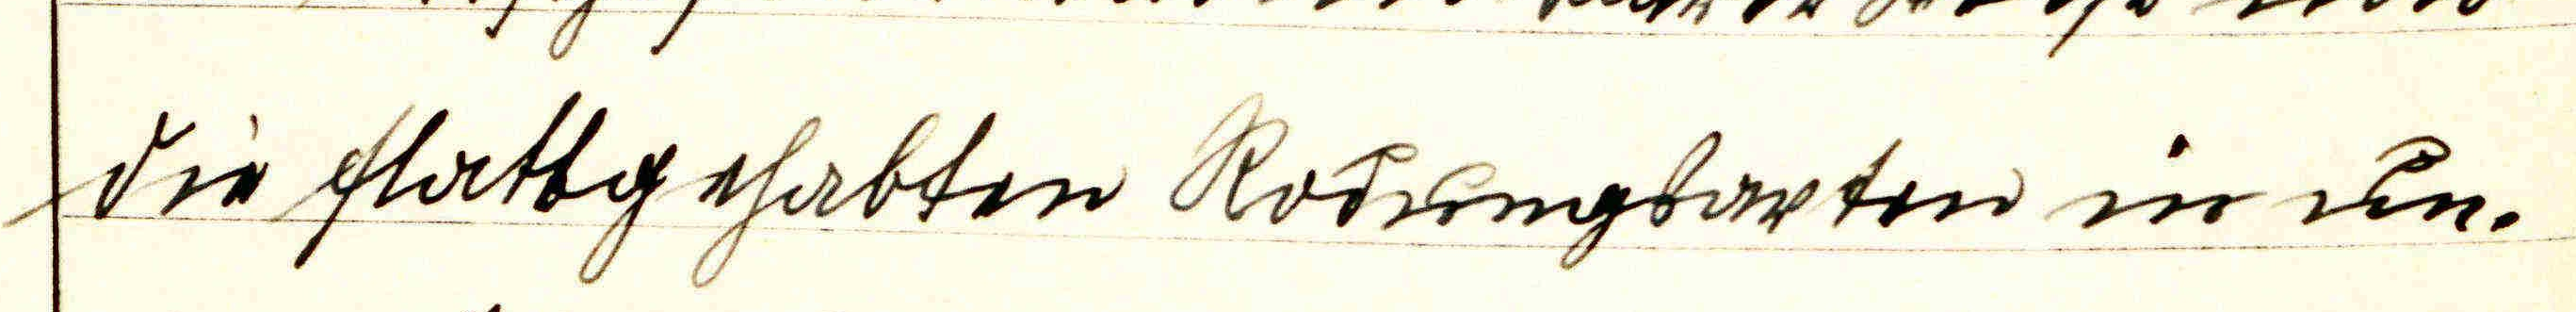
die sattgehabten Rodungsarten in un-
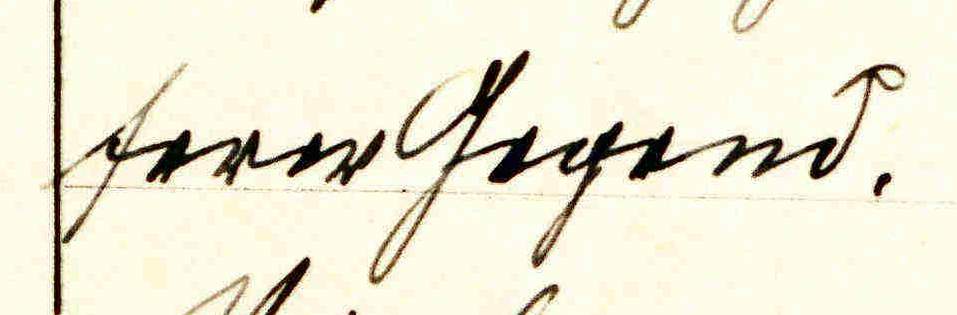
serer Gegend.
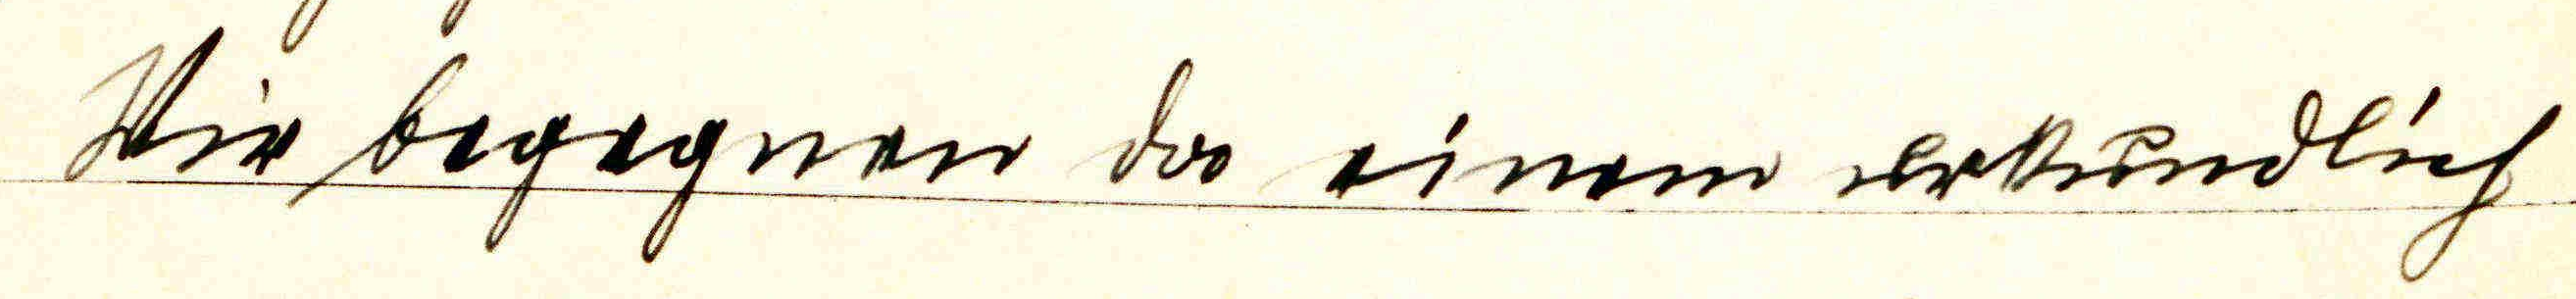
Wir begegnen da einem urkundlich
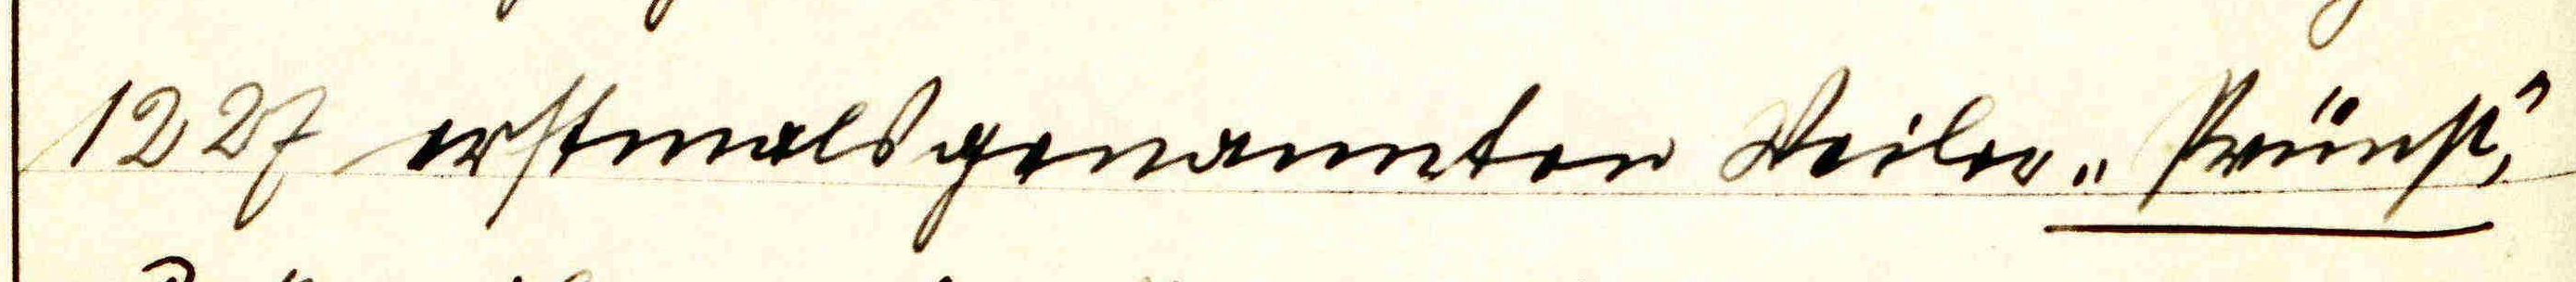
1227 erstmals genannten Weiler "Prünst,"
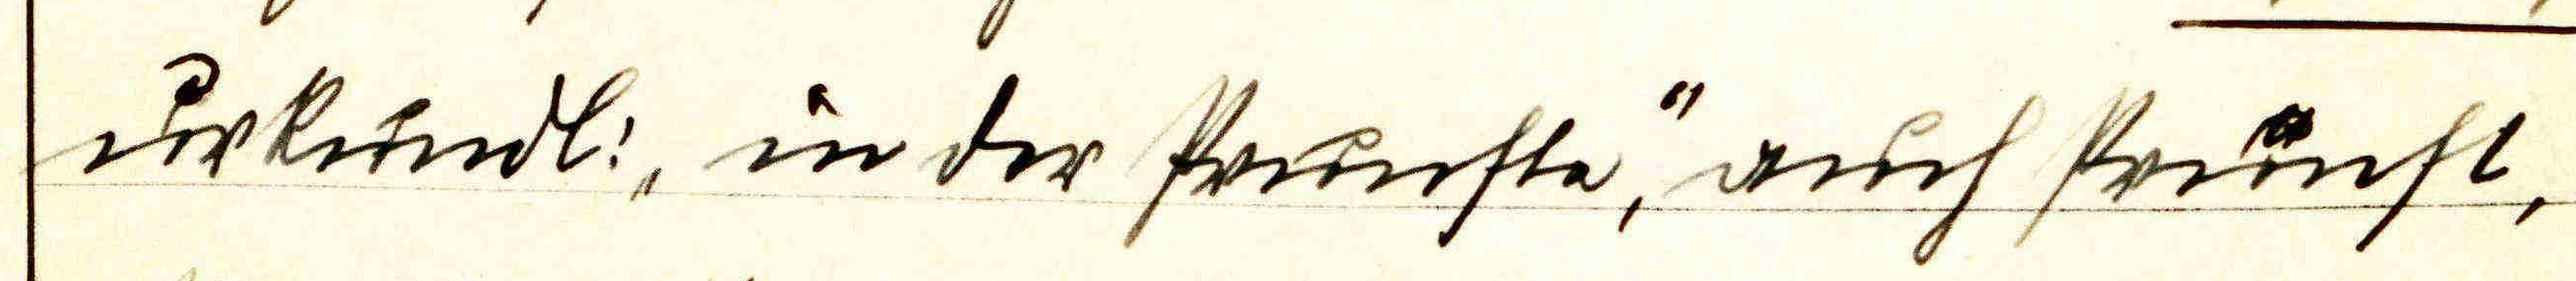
urkundl: "in der Prunste", auch Ptunst,
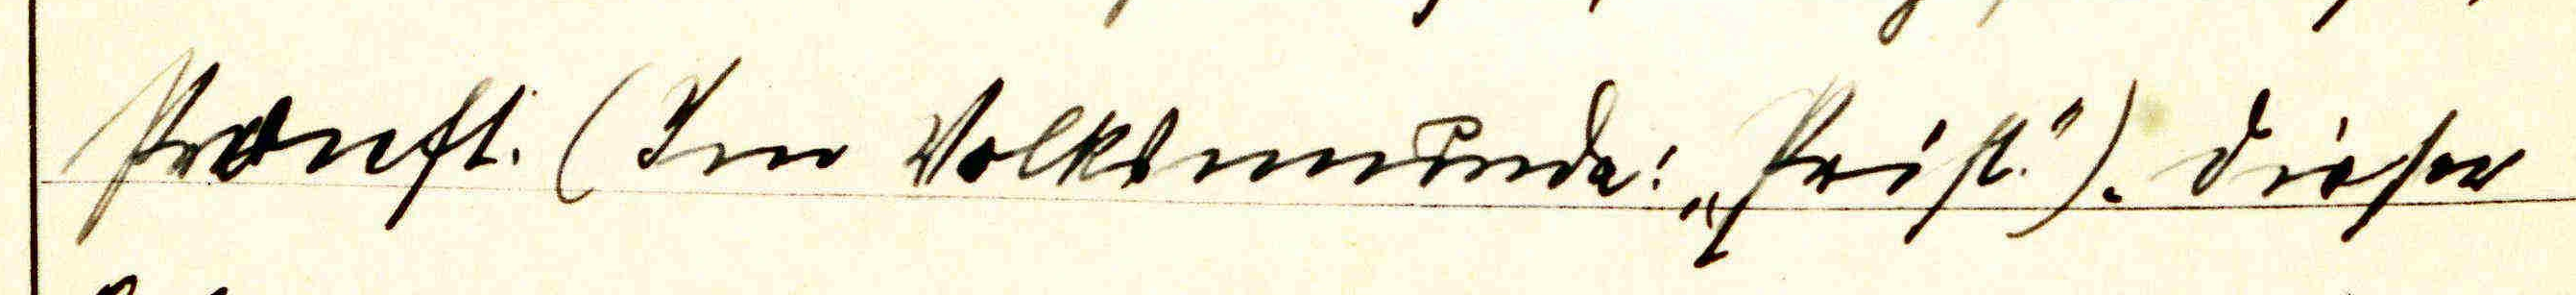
Ptonst. (Im Volksmunde: "Prist"). Dieser
